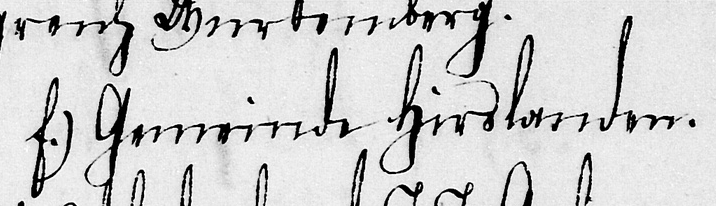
f.) Gemeinde Hirslanden.
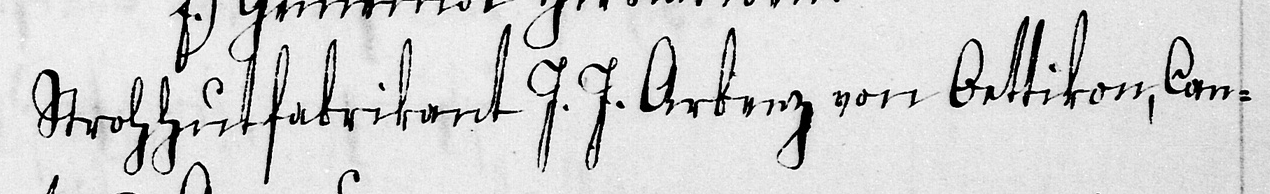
Strohhutfabrikant J. J. Arbenz von Oettikon, Can¬
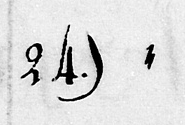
24.) “
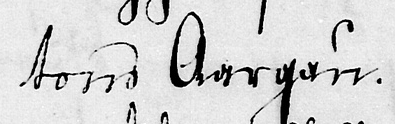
tons Aargau.
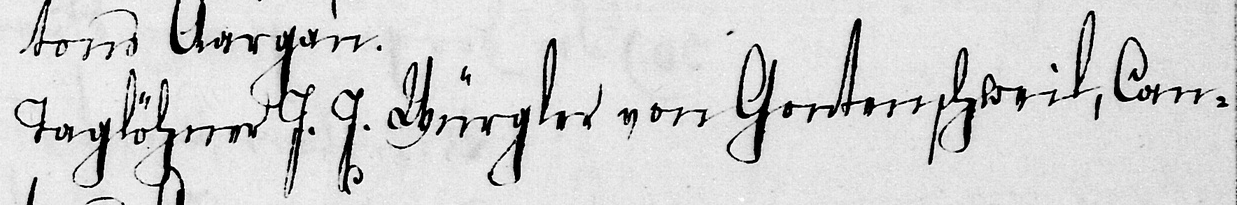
Taglöhner J. J. Würgler von Gontenschweil, Can¬
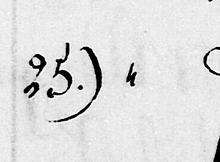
25.) “
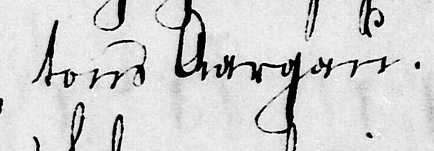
tons Aargau.
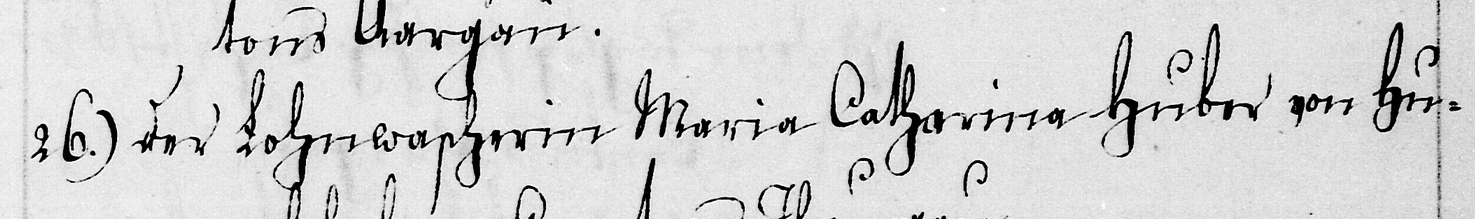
26.) Der Lohnwascherin Maria Catharina Huber von Hu¬
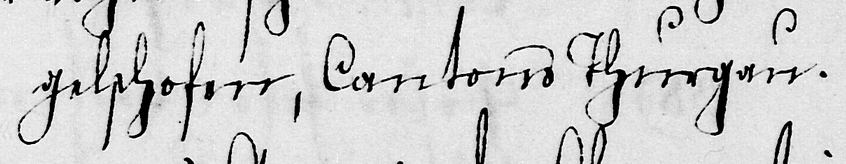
gelschofen, Cantons Thurgau.
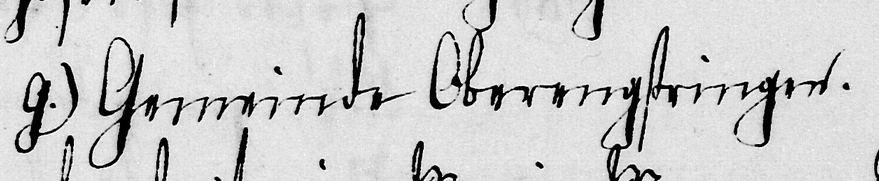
g.) Gemeinde Oberengstringen.
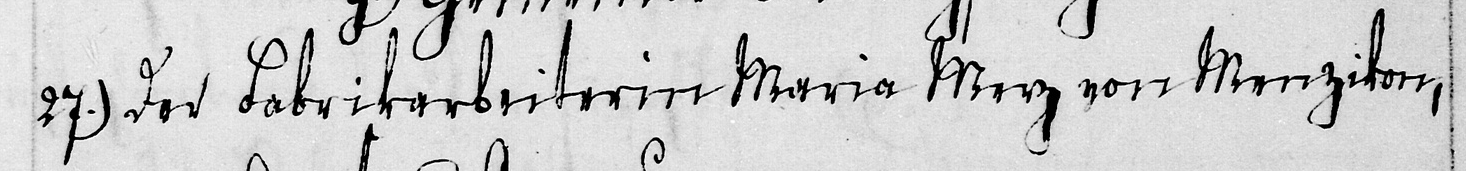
27.) Der Fabrikarbeiterin Maria Merz von Menzikon,
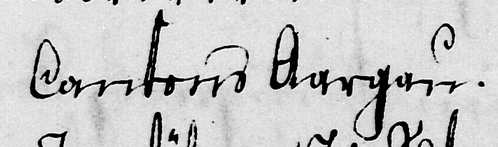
Cantons Aargau.
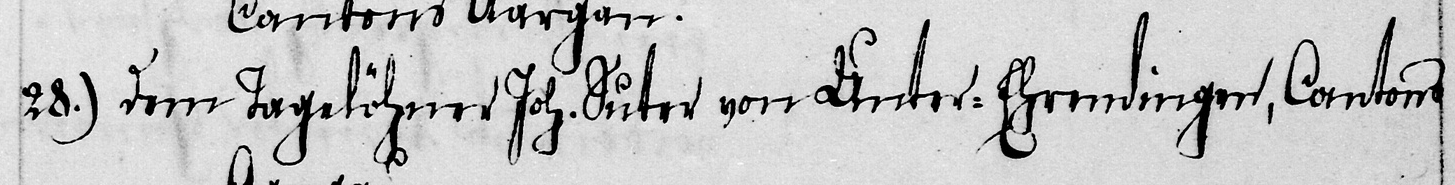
28.) Dem Tagelöhner Joh. Suter von Unter-Ehrendingen, Cantons
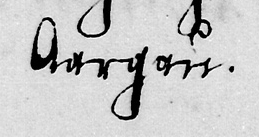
Aargau.
